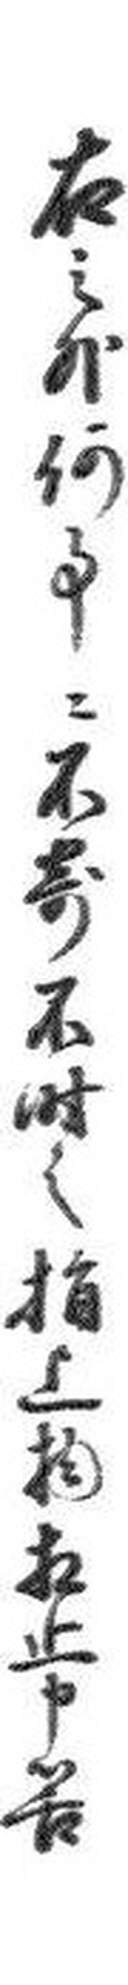右之外何事ニ不寄不時之指上物相止申筈

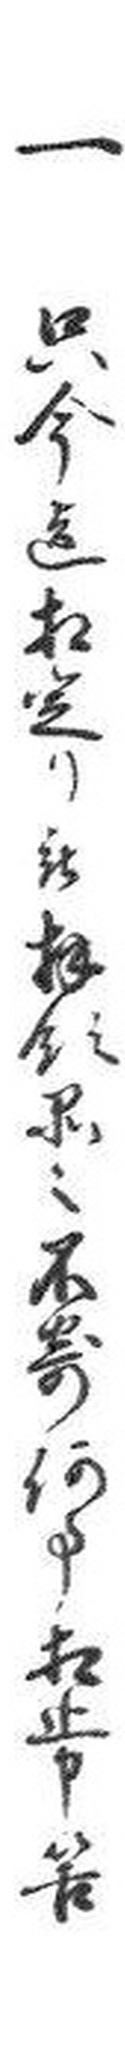一只今迄相定り被拝領品々不寄何事相止申筈
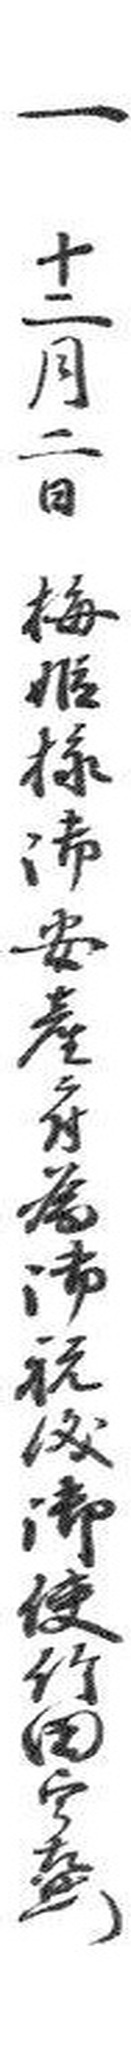一十二月二日梅姫様御安産ニ付為御祝儀御使武田宇左衛門
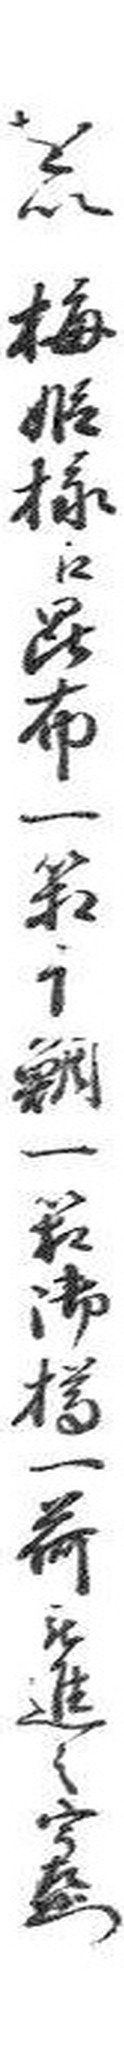を以梅姫様江昆布一箱干鯛一箱御樽一荷被進之宇左衛門
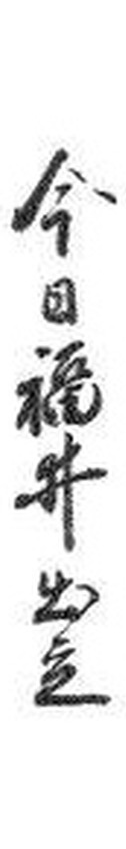今日福井出立
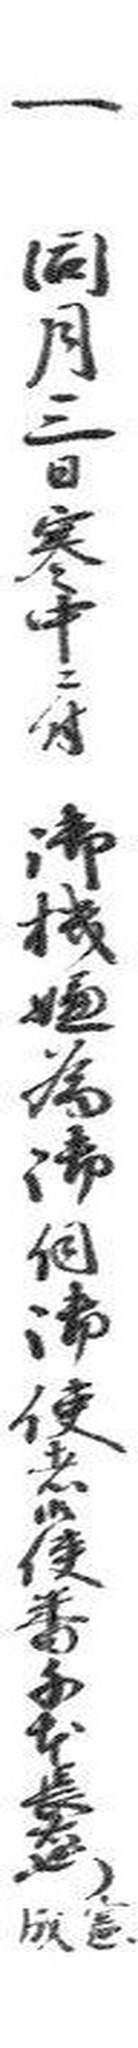一同月三日寒中ニ付御機嫌為御伺御使者御使番千本長右衛門憲成
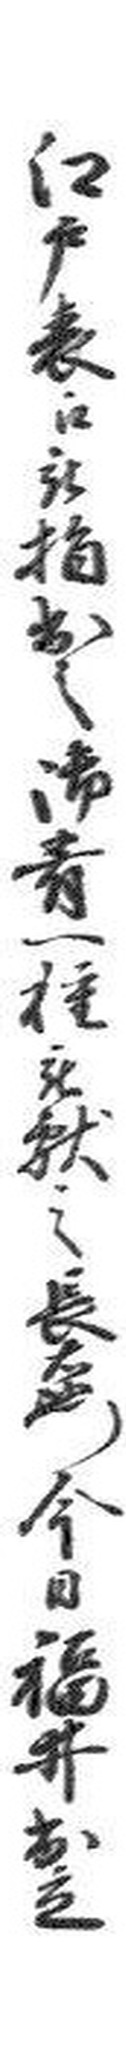江戸表江被指出之御肴一種被献之長右衛門今日福井出立
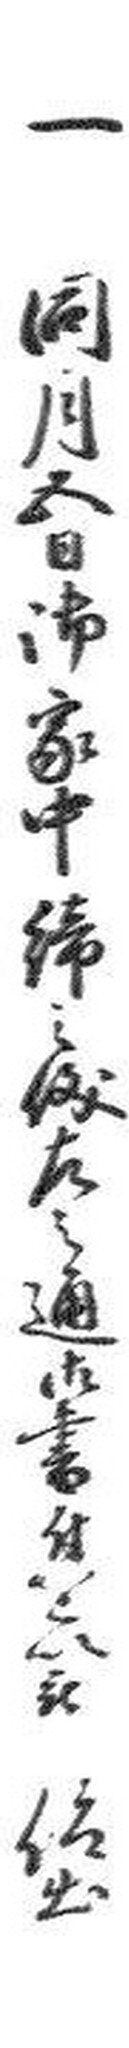一同月五日御家中締之儀左之通御書付を以被仰出
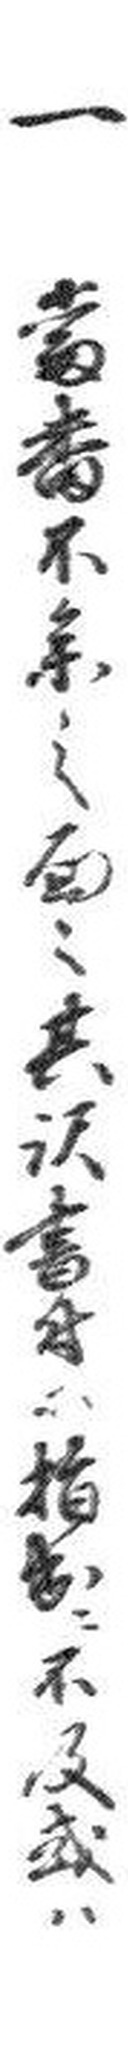一当番不参之面々其訳書付等指出ニ不及或ハ
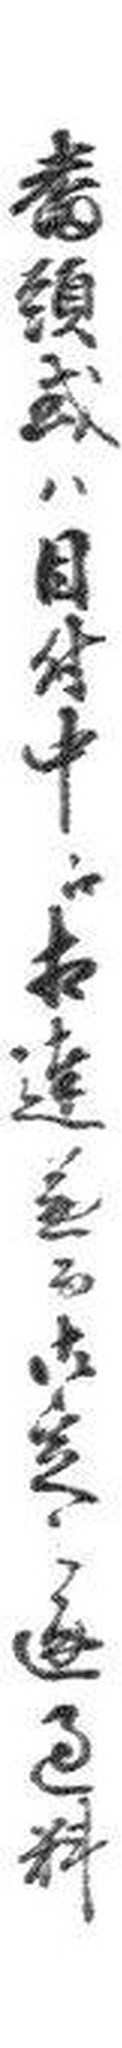番頭或ハ目付中江相達兼而御定之通過料
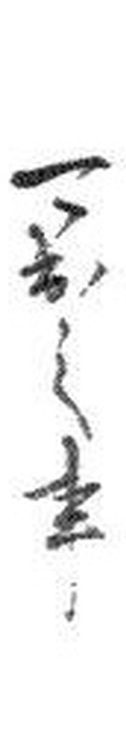可出之事
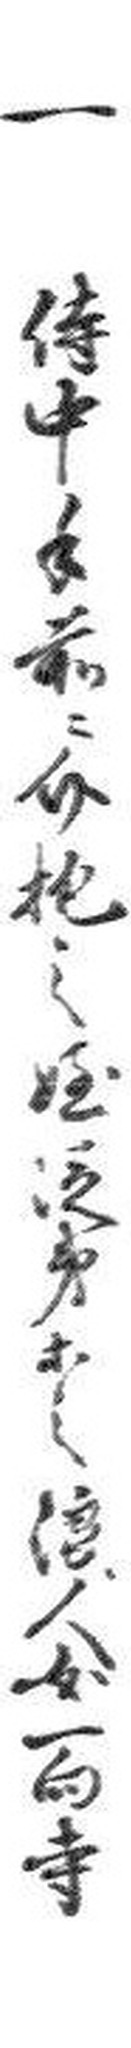一侍中手前ニ介抱之姪従弟等之浪人女一向寺
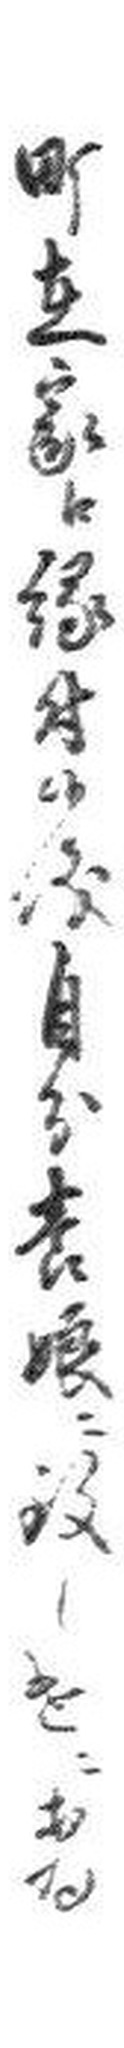町在家江縁付候儀自分養娘ニ致し遣ニおゐ
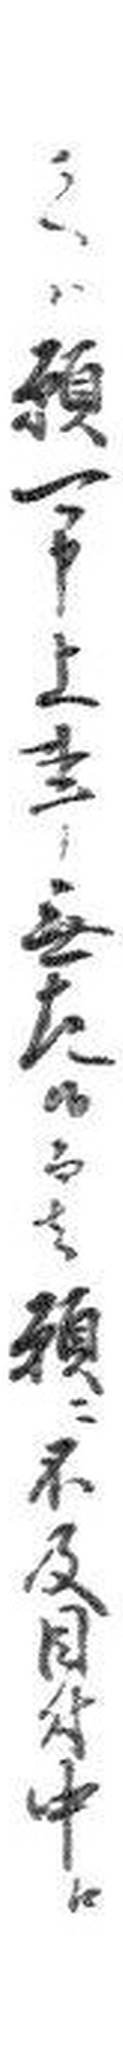てハ願可申上事無左候而者願ニ不及目付中江
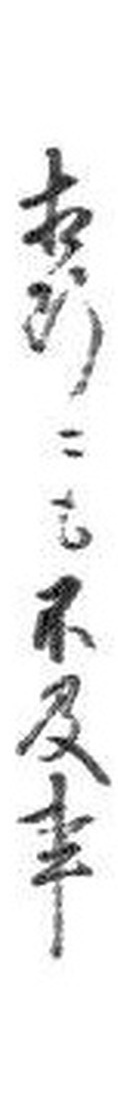相断ニも不及事
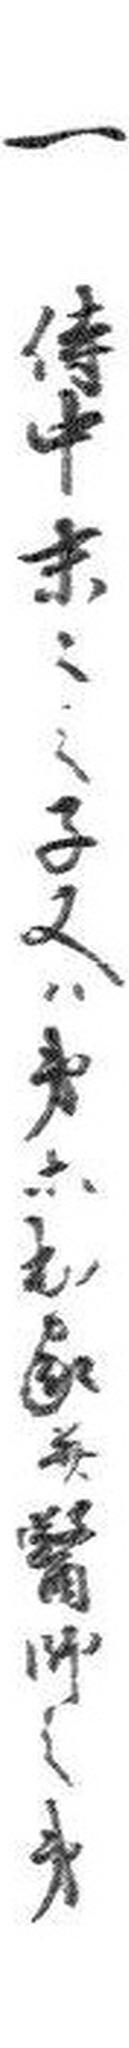一侍中末々之子又ハ弟等出家并医師之弟
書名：家譜 二十八 吉邦公 従宝永七年七月五日到正徳元年十二月
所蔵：福井県文書館 Fukui Prefectural Archives
